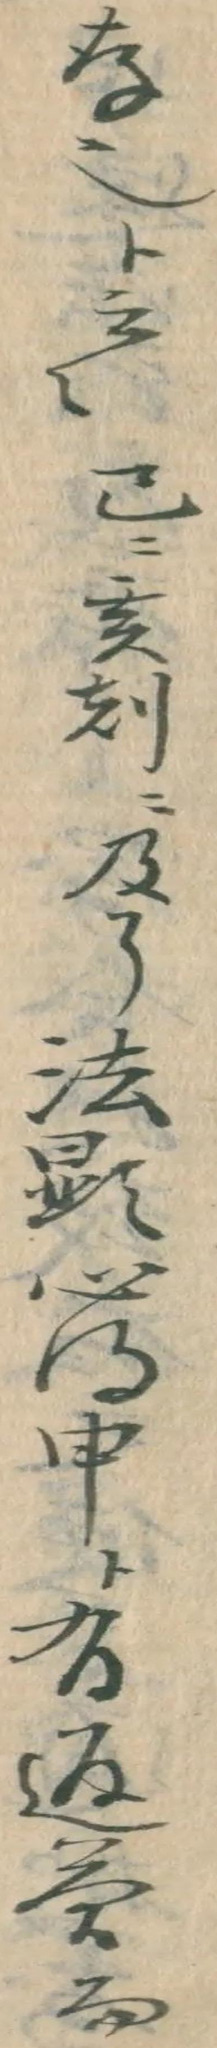存也ト云々巳ニ亥刻ニ及了法顕心得申ト有返答而

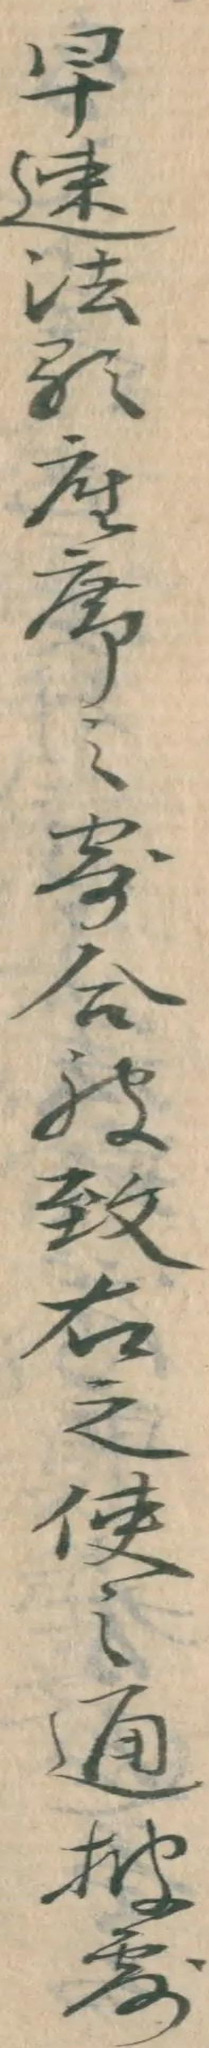早速法顕座席之寄合被致右之使之通披露
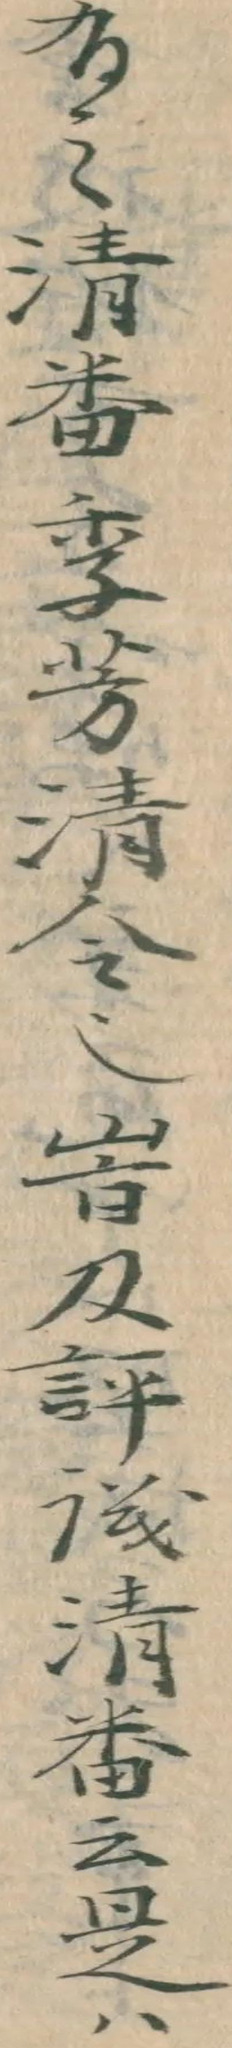有之清番季芳清令也旹及評議清番云是ハ
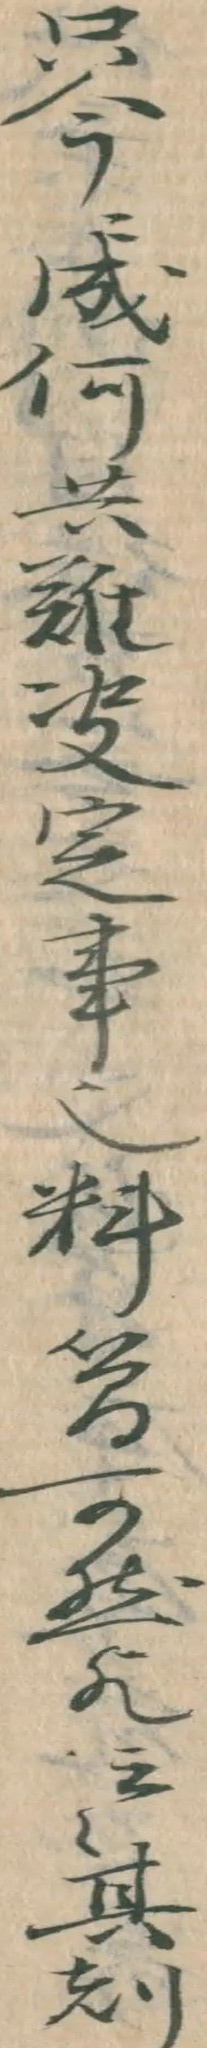只今ニ成何共難決定事也料簡可然歟云々其刻
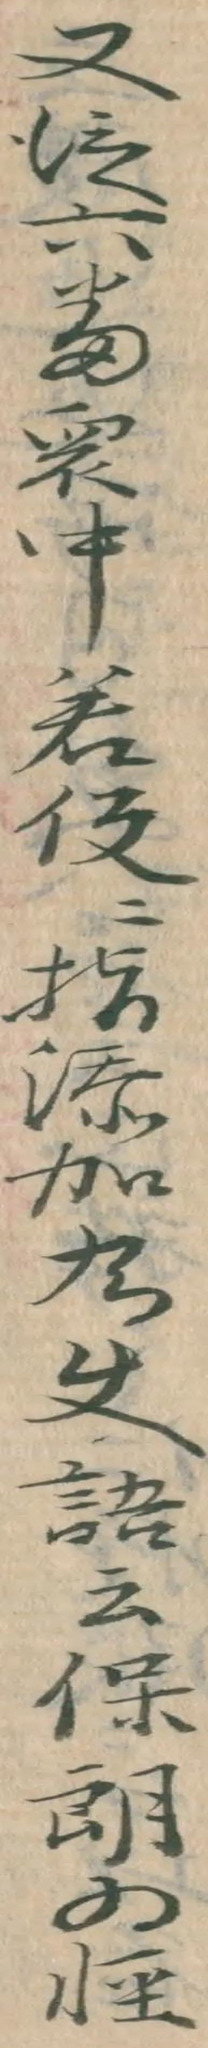又従六番衆中若役ニ指添加為使語云保朗為軽
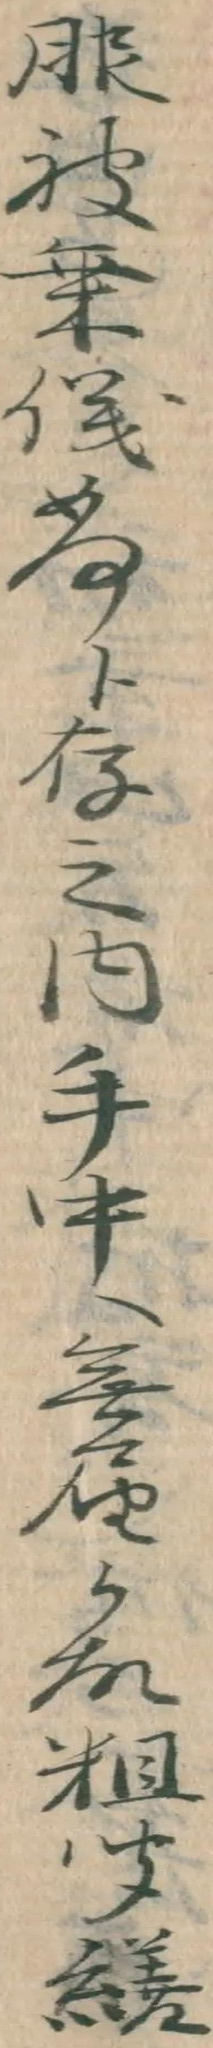服被乗儀如何ト存之内手中へ無届候故粗聞繕
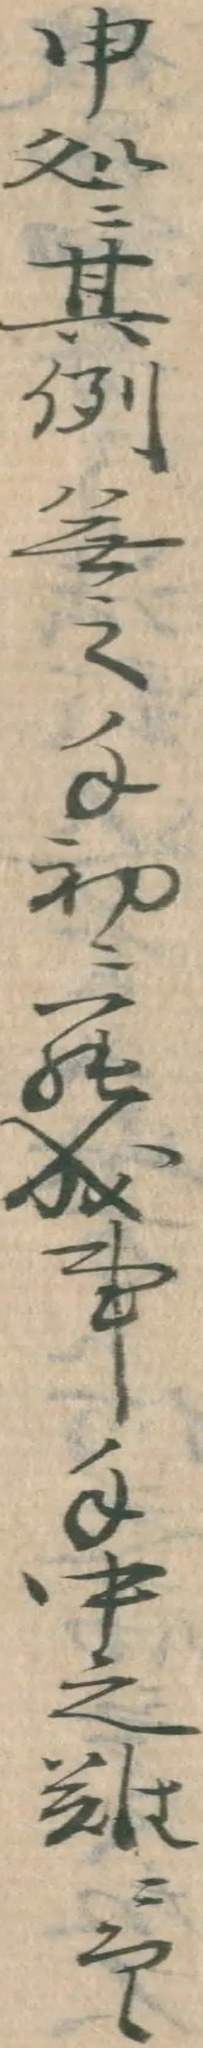申処ニ其例無之手初ニ罷成事手中之難ニ而候
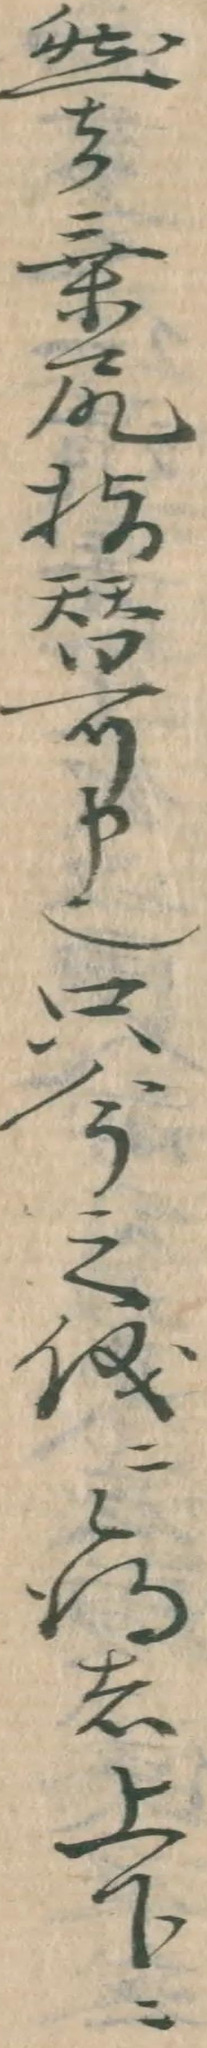然者乗尻指替可申也只今之儀ニ候得者上下ニ
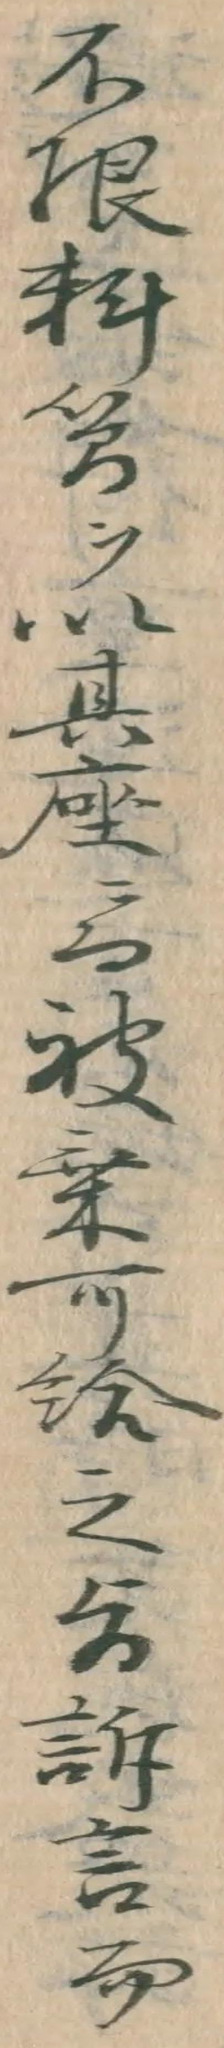不限料簡ヲ以其座ニ而被乗可給之旨訴言而
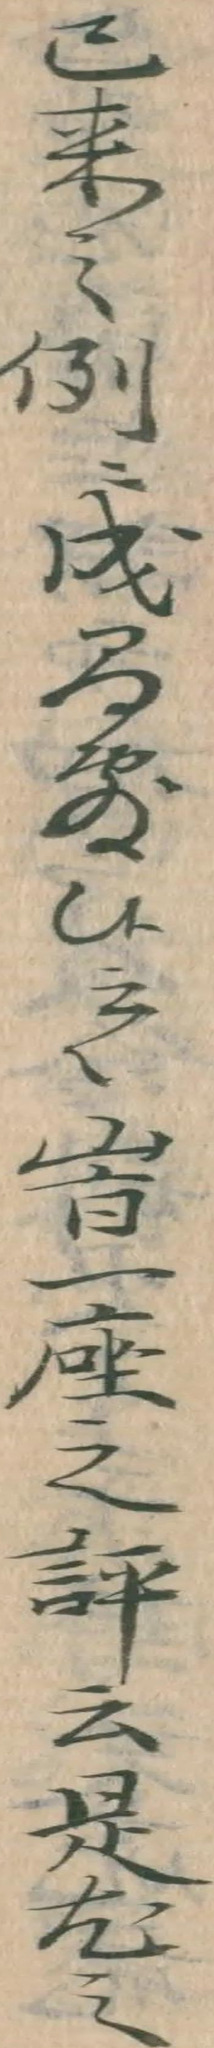已来之例ニ成間敷候云々旹一座之評云是尤之
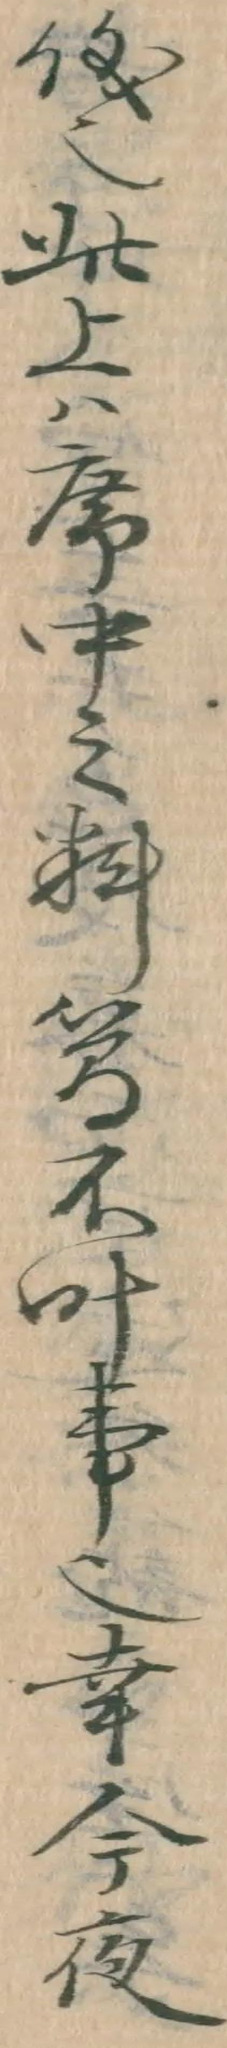儀也此上ハ席中之料簡不叶事也幸今夜
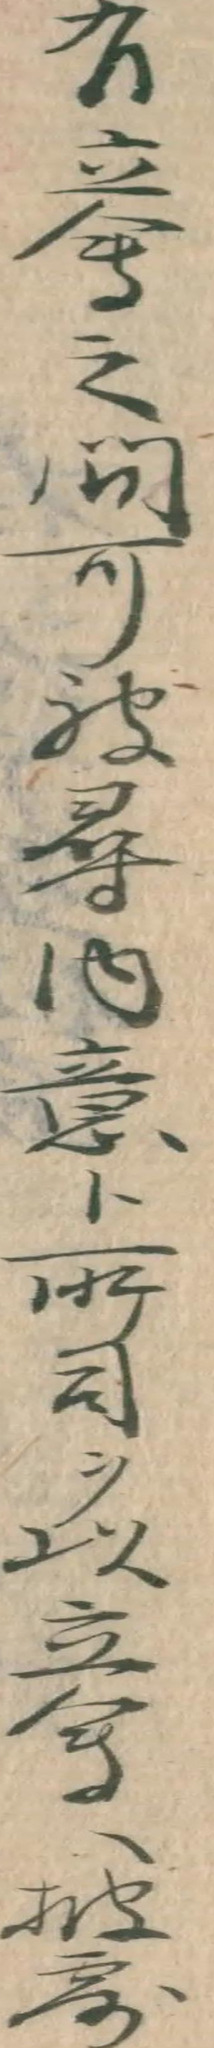有立会之間可被尋内意ト所司ヲ以立会ヘ披露
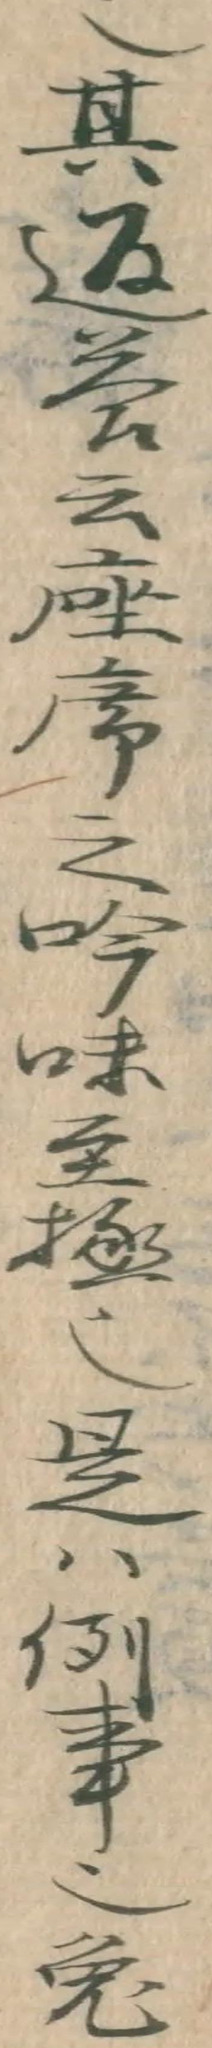也其返答云座席之吟味至極也是ハ例事也兎
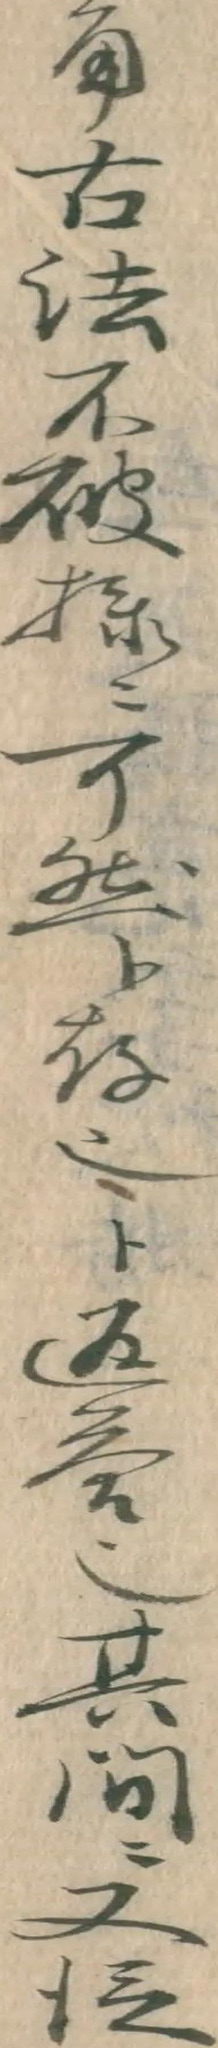角古法不破様ニ可然ト存也ト返答也其間ニ又従
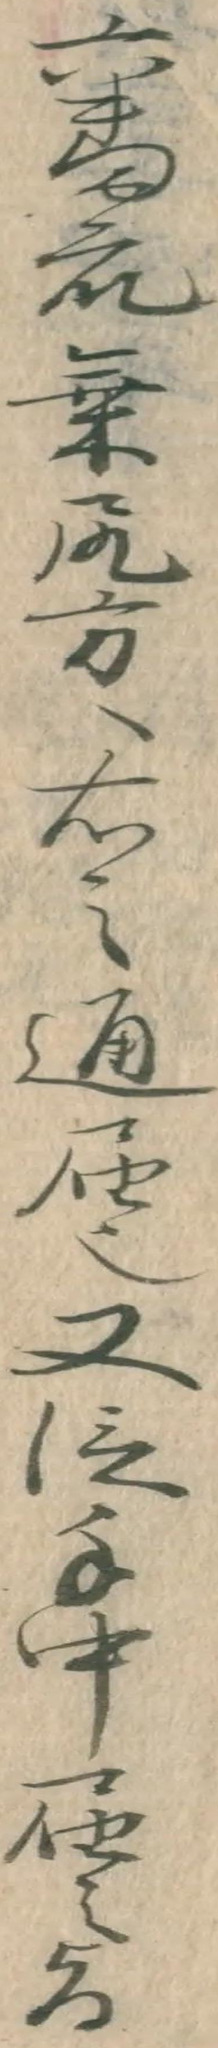六番衆乗尻方ヘ右之通届也又従手中届之旨
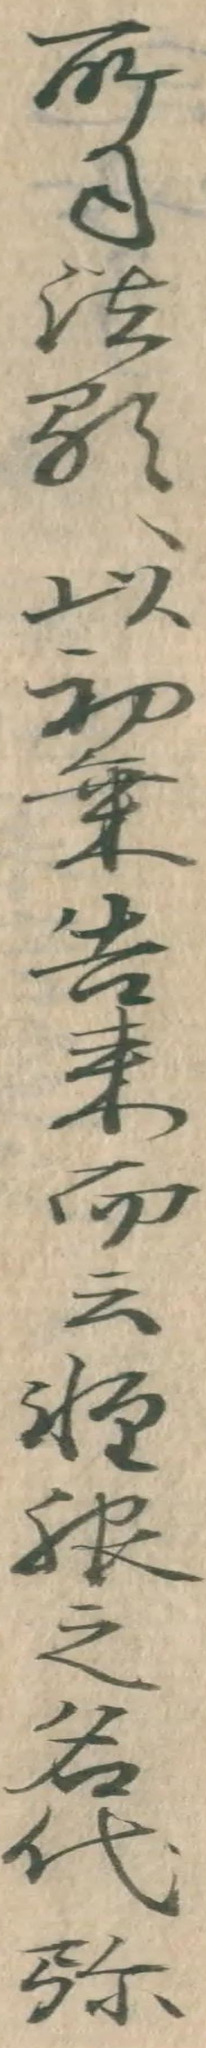所司法顕ヘ以初乗告来而云軽服之名代弥
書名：賀茂社記録. 第10冊
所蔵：国立国会図書館 National Diet Library, JAPAN
